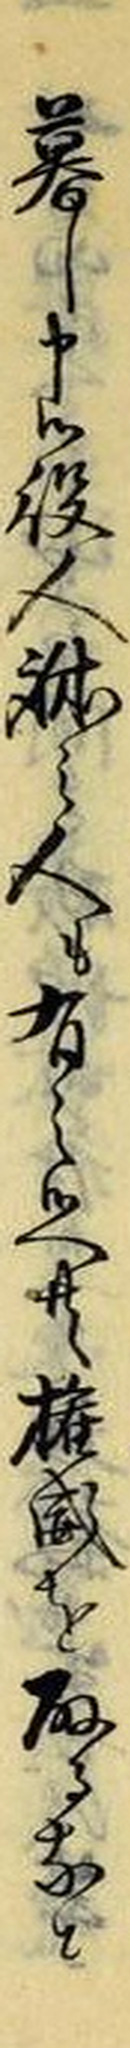暮し申候役人躰之人も有之候へ共権威を取るなと
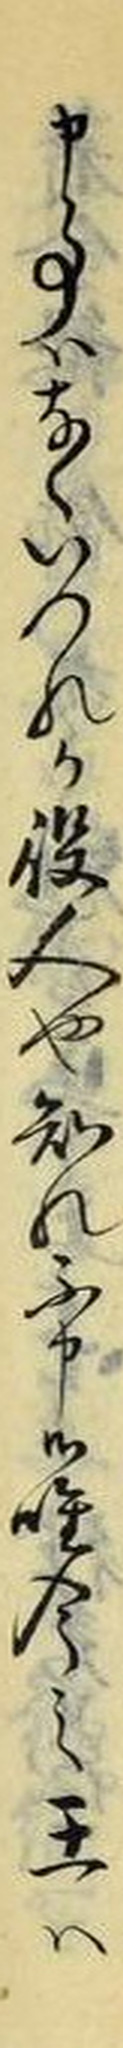申事ハなくいつれか役人や知れ不申候唯今之王ハ
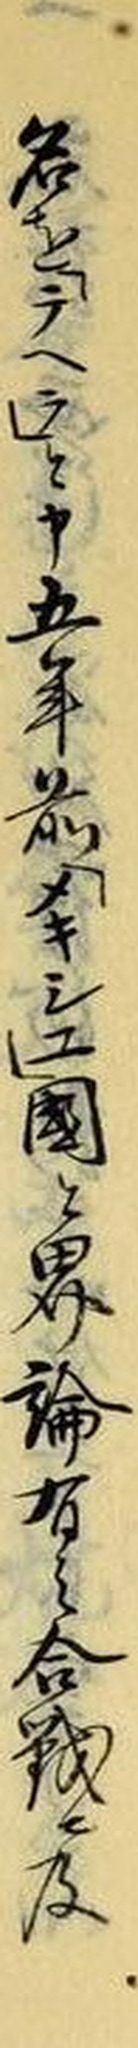名を「テへラ」と申五年前「メキシユ」国と界論有之合戦二及
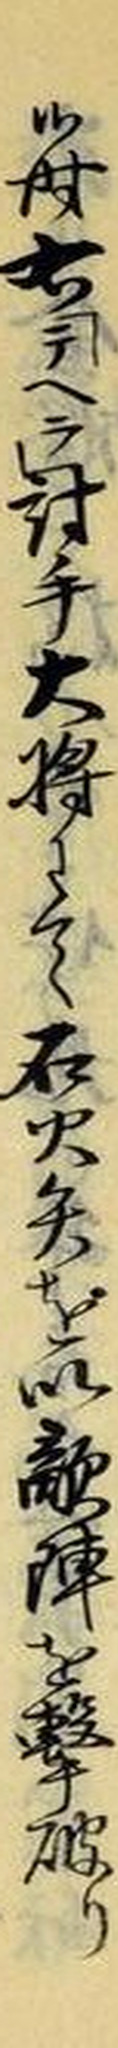候時右「テへラ」討手大将にて石火矢を以敵陣を撃破り
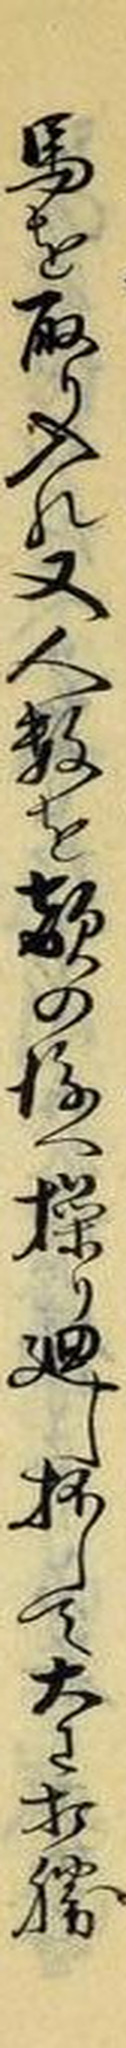馬を取り入れ又人数を敵の後へ繰廻し抔して大に打勝
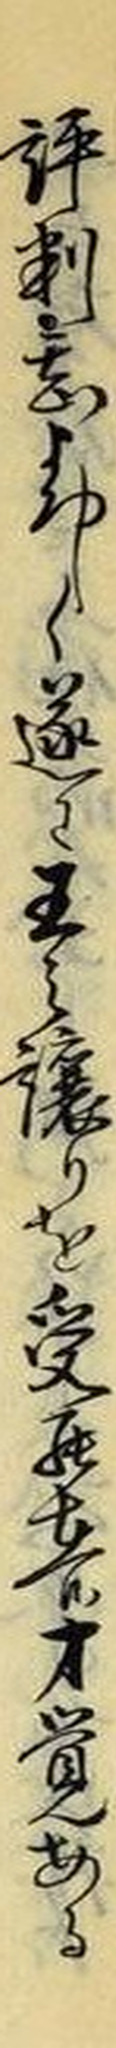評判甚よろしく遂に王之譲りを受罷在候才覚ある
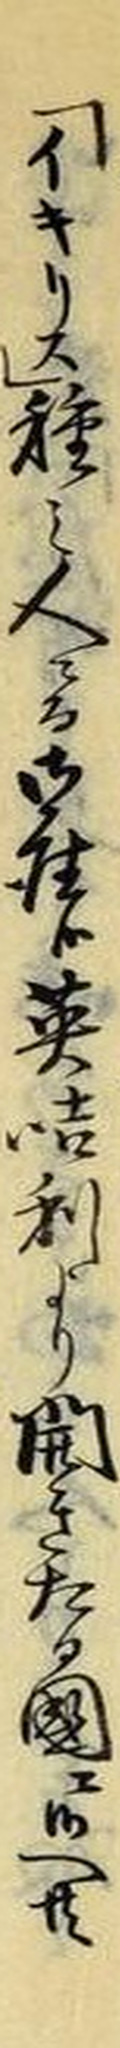「イキリス」種之人ニ而御座候英吉利より開きたる国ニそう候へ共
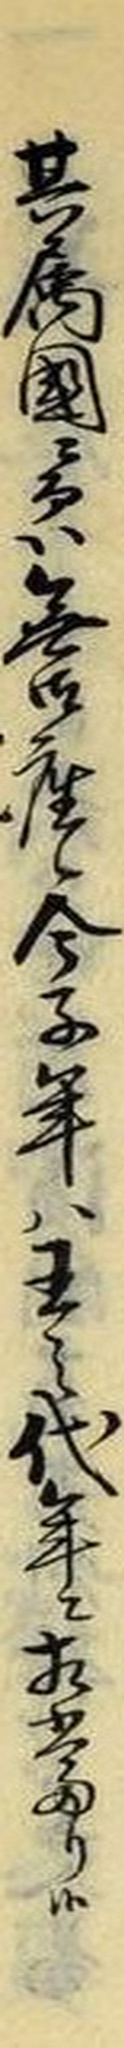其属国ニ而ハ無御座候今子年ハ王之だ代ニ相當り候
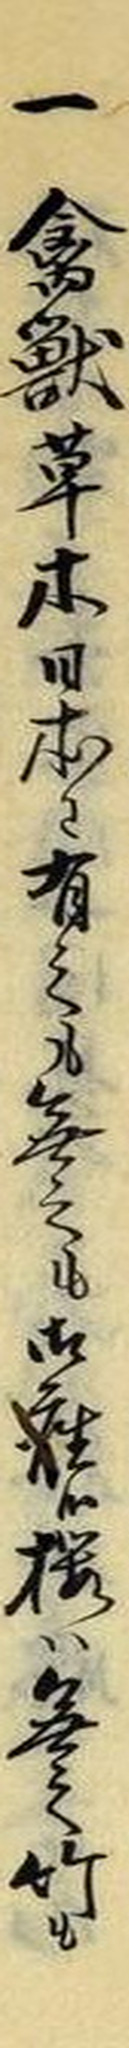一禽獣草木日本に有之も無之も御座候桜ハ無之竹も
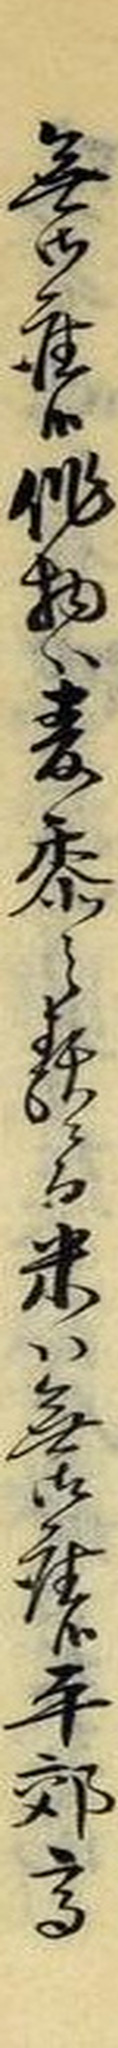無御座候作物ハ麦黍の類ニ而米ハ無御座候平郊高
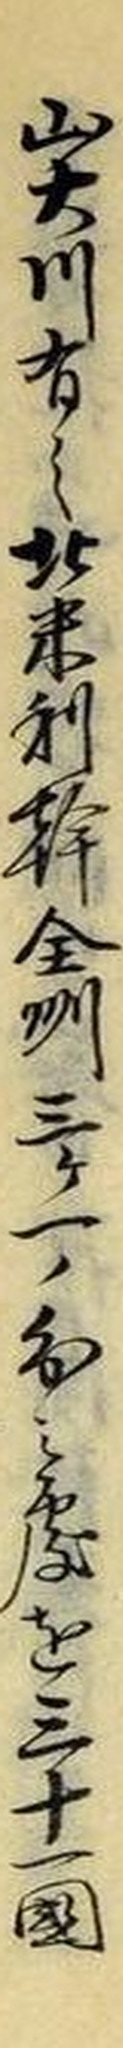山大川有之北米利幹全州三ケ一ノ分之處を三十一国
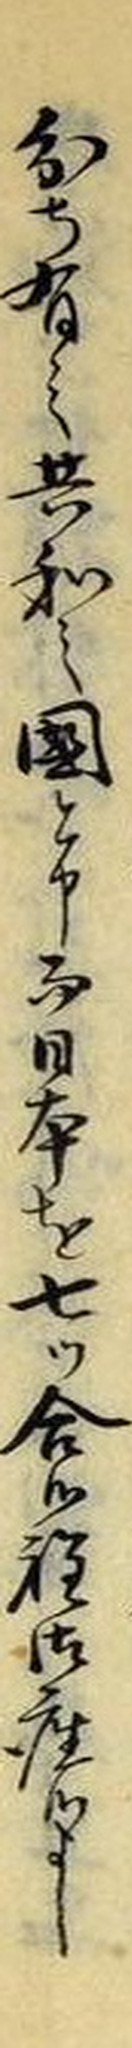分ち有之共和之国と申而日本を七ツ合候程御座候よし
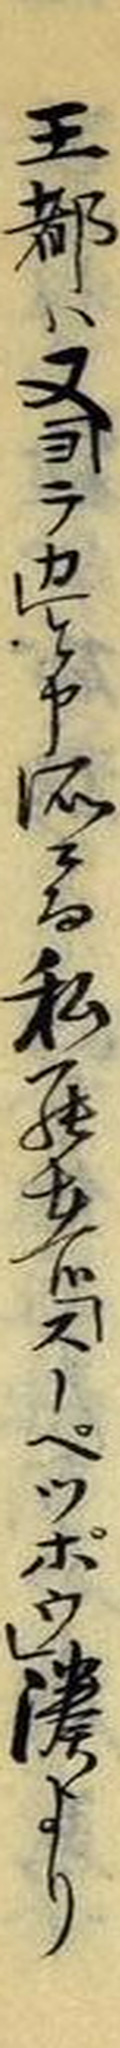王都ハ又「ヨラカ」と申所ニ而私罷在候「スーぺツポウ」湊より
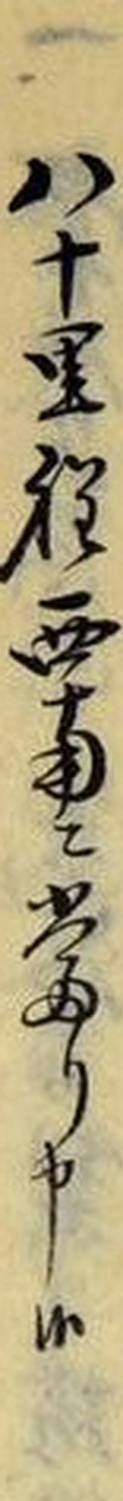八十里程西南ニ當り申候

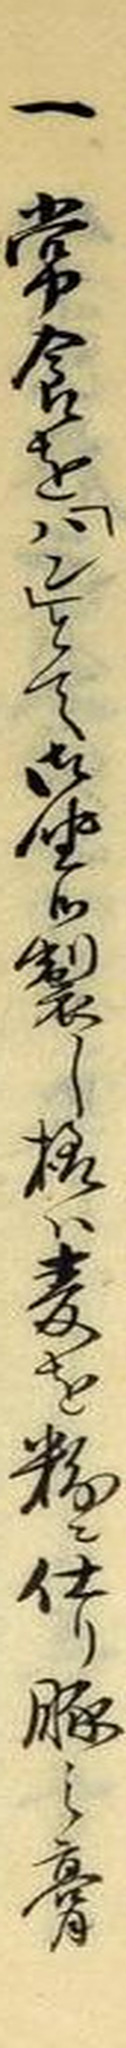一常食を「ハン」とて御座候製し様ハ麦を粉ニ仕り豚之膏
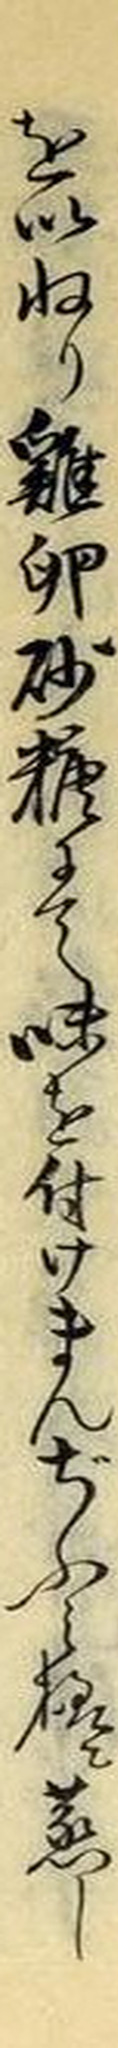を以ねり鶏卵砂糖にて味を付けまんぢふ之様ニ蒸し
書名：漂客談奇（備考雑録写8）
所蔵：福井県文書館 Fukui Prefectural Archives
